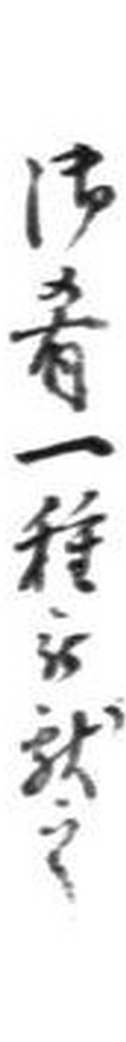御肴一種被献之
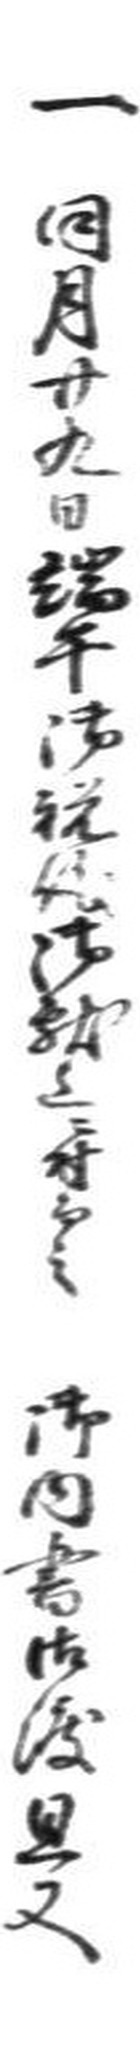一同月廿九日端午御祝儀御献上ニ付而之御内書御渡且又
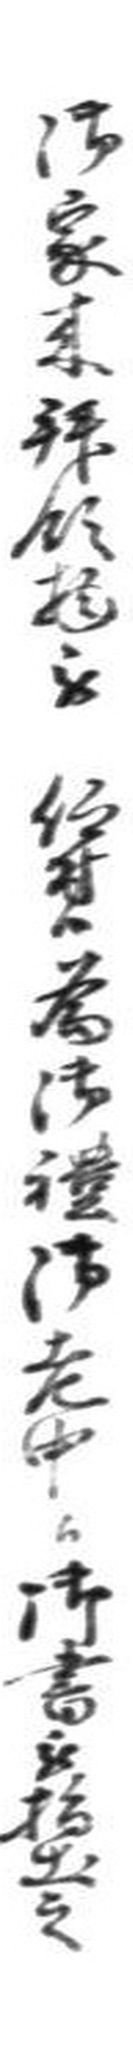御家来拝領物被仰付候為御礼御老中江御書被指出之

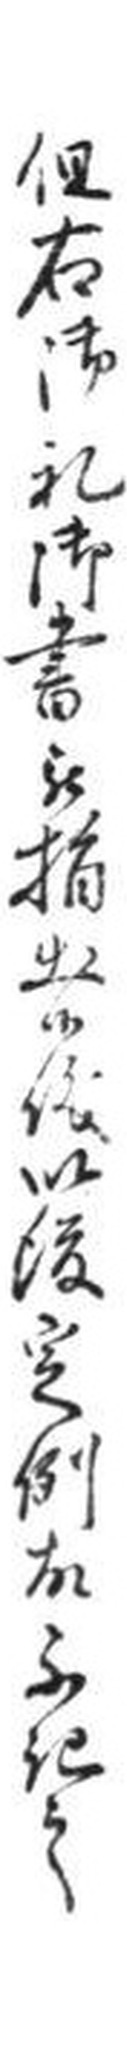但右御礼御書被指出候儀以後定例故不記之
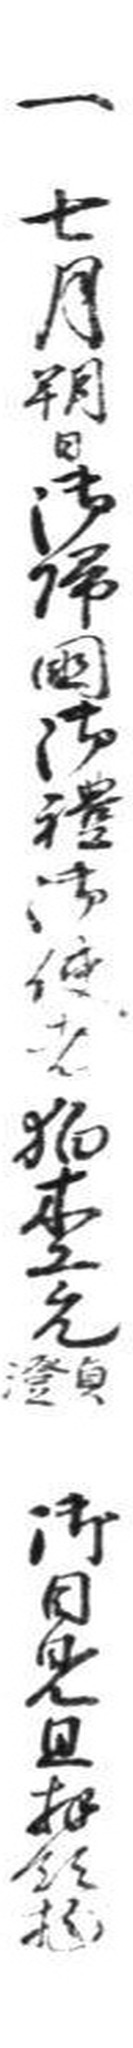一七月朔日御帰国御礼御使者狛木工允貞澄御目見且拝領物
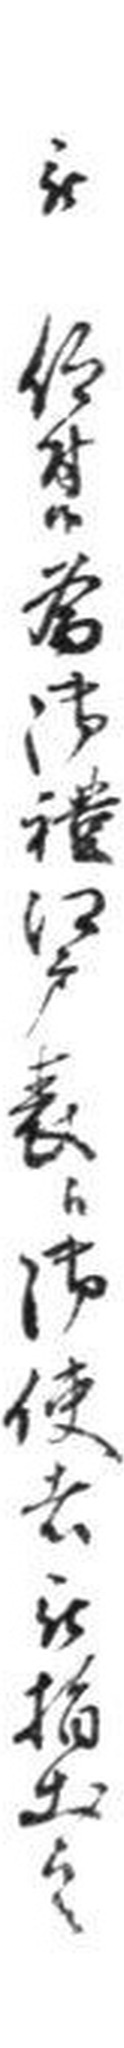被仰付候為御礼江戸表江御使者被指出之
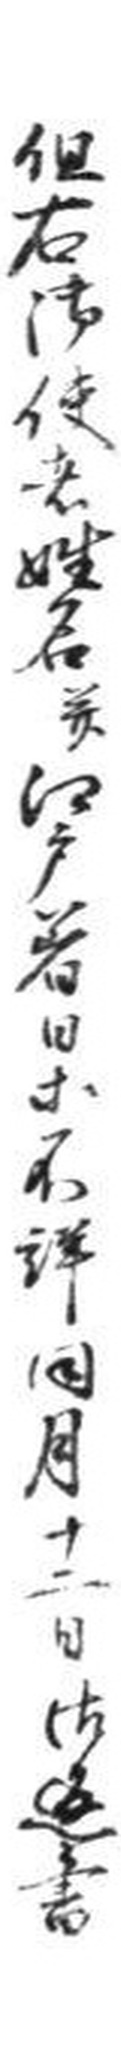但右御使者姓名并江戸着日等不詳同月十二日御返書
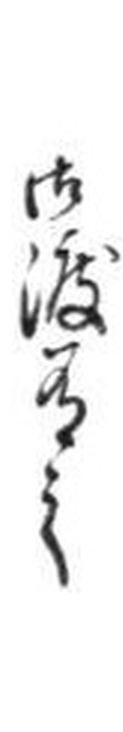御渡有之
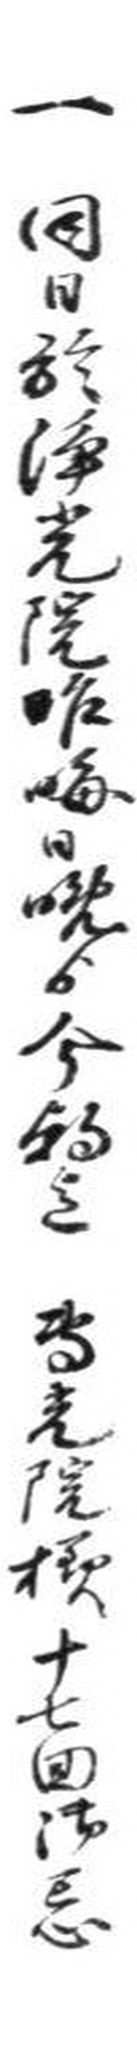一同日於浄光院昨晦日晩ゟ今朝迄専光院様十七回御忌
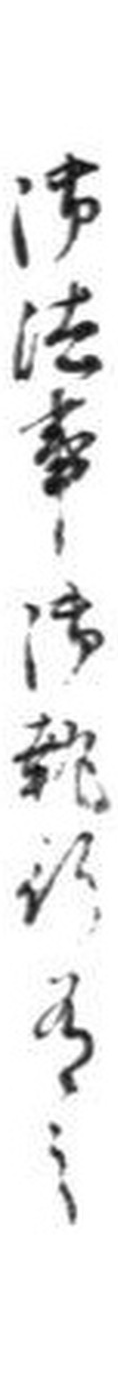御法事御執行有之
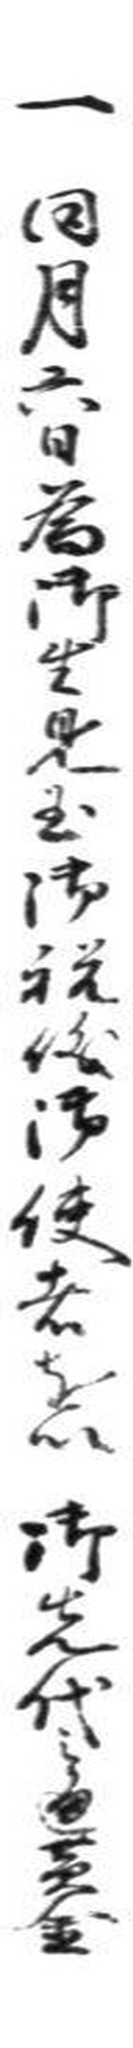一同月六日為御生見玉御祝儀御使者を以御先代之通黄金
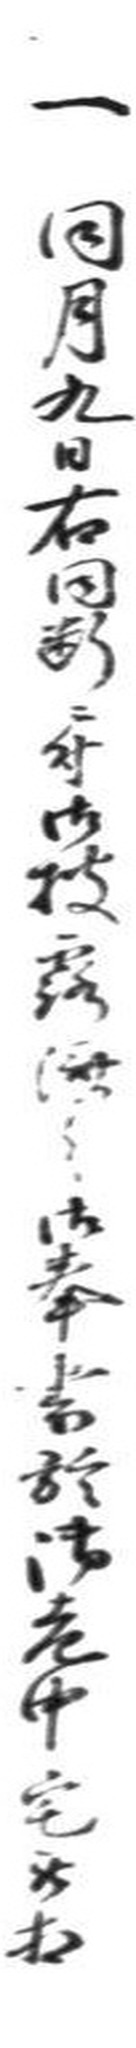一同月九日右同断ニ付御披露済之御奉書於御老中宅被相
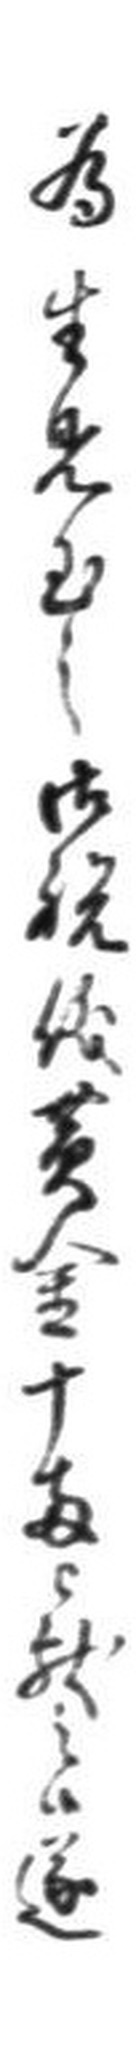為生見玉之御祝儀黄金十両被献之候遂
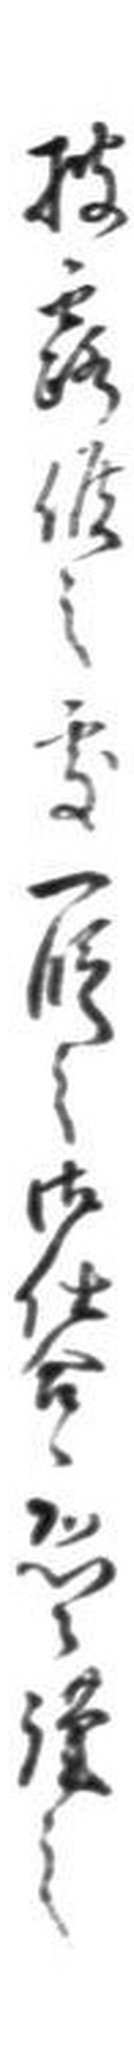披露候之処一段之御仕合候恐々謹言
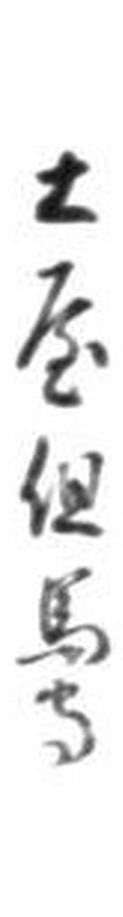土屋但馬守
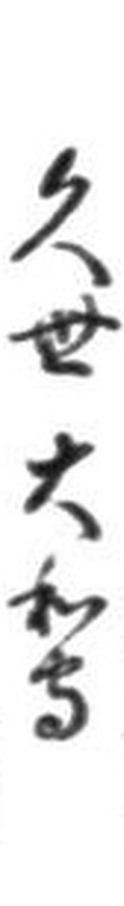久世大和守
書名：家譜 十三 綱昌公 従寛文元年到延宝五年
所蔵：福井県文書館 Fukui Prefectural Archives
